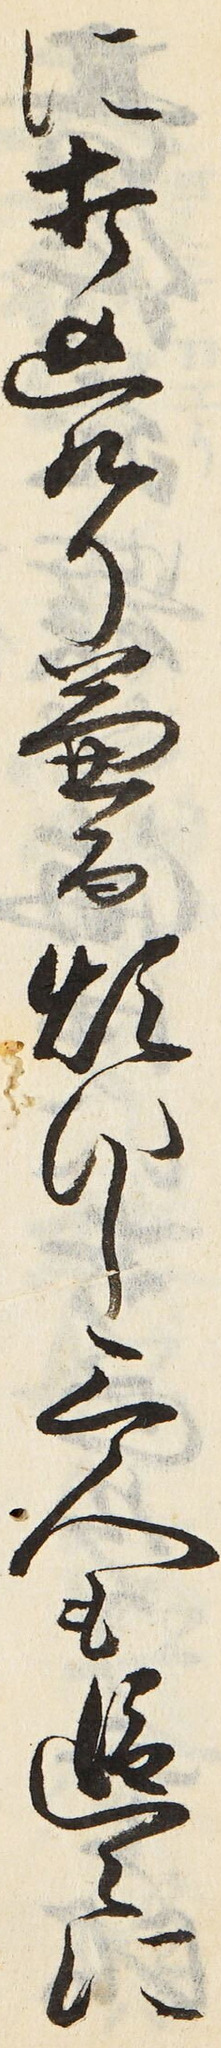に打込けり兼而煩ひし三人も追々に
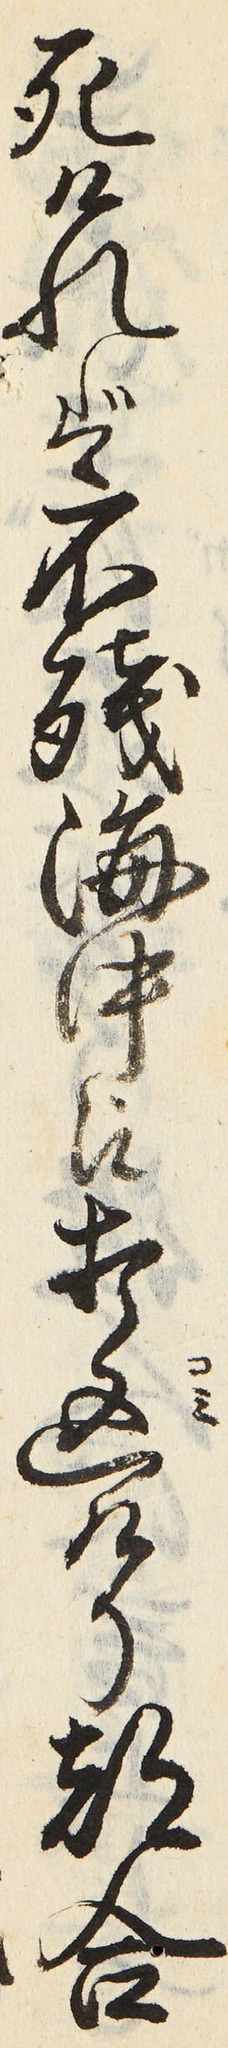死ければ不残海中え打込けり都合
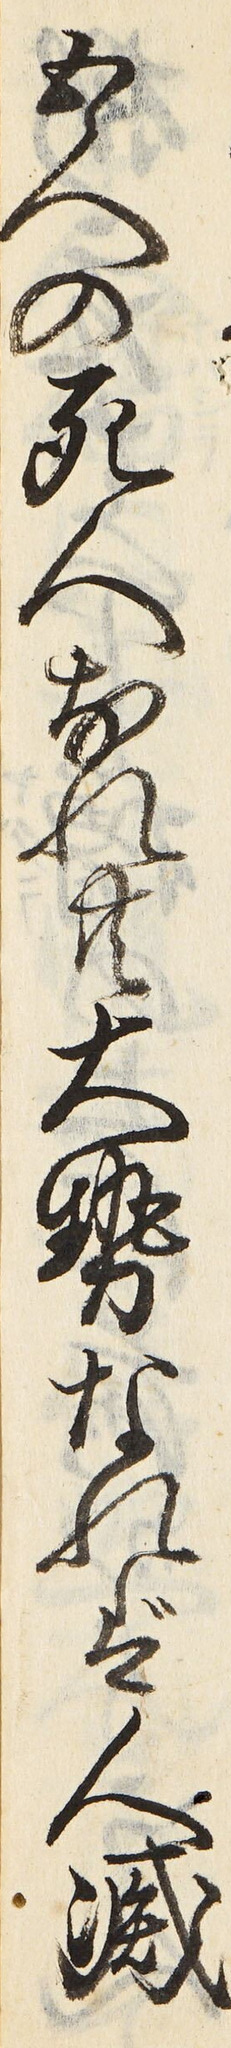五人の死人なれ共大勢なれば人滅
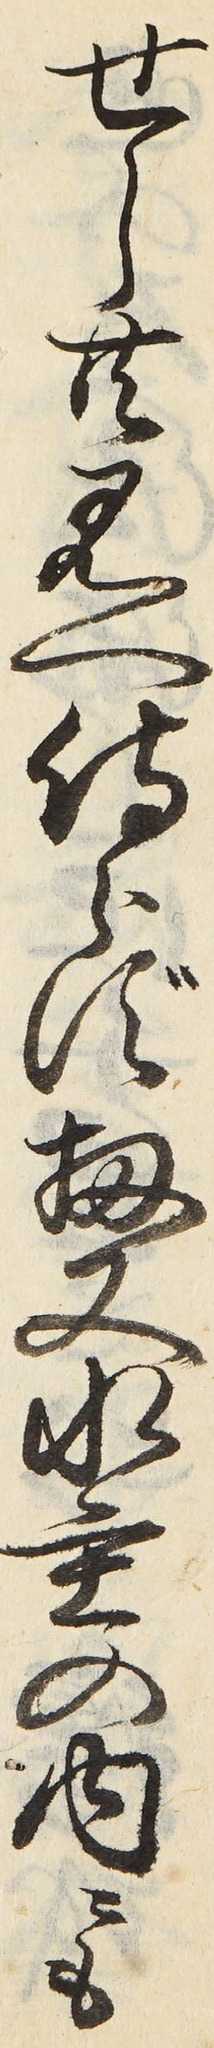せし共見へ侍らず扨又水主の内にも
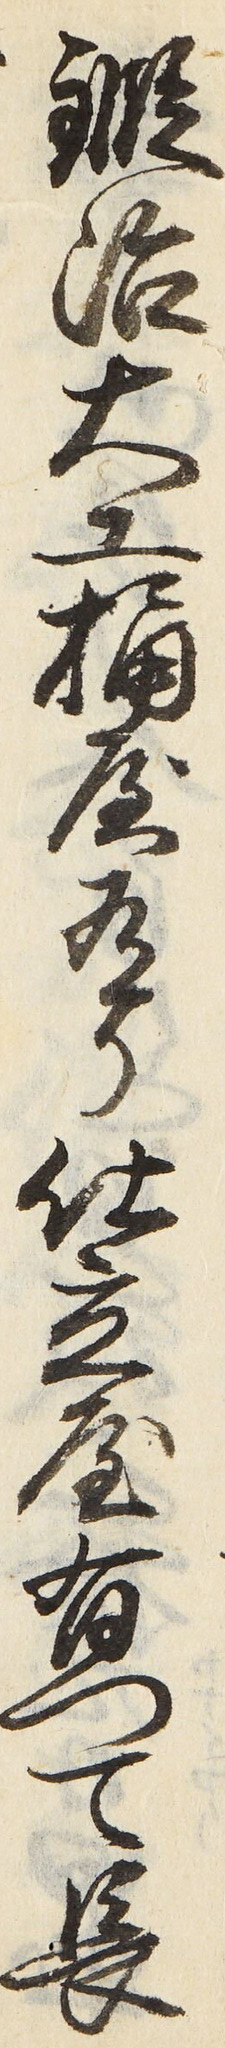鍛冶大工桶屋有り仕立屋有つて長
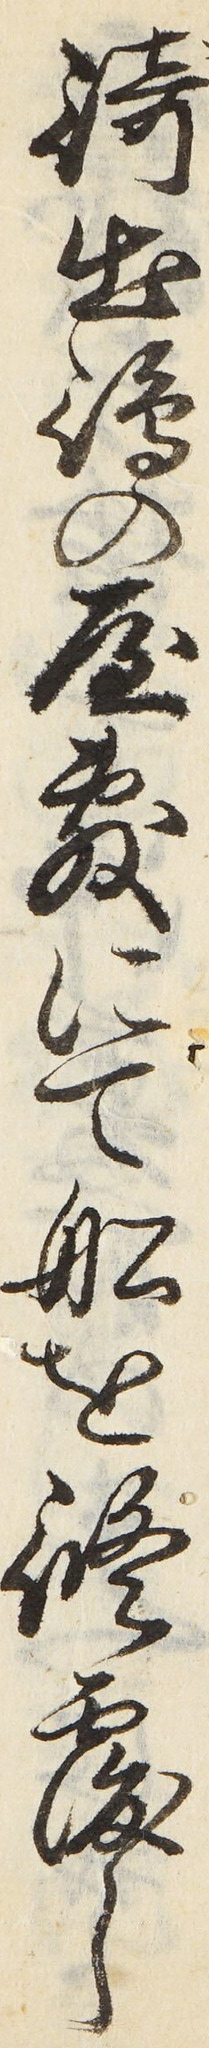崎出嶋の屋敷にて船を修覆し
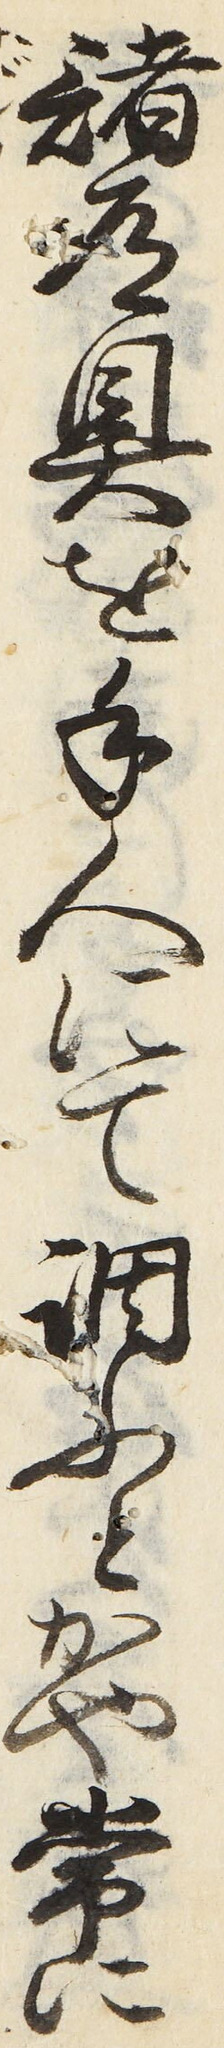諸道具を手人にて調ふとかや常に
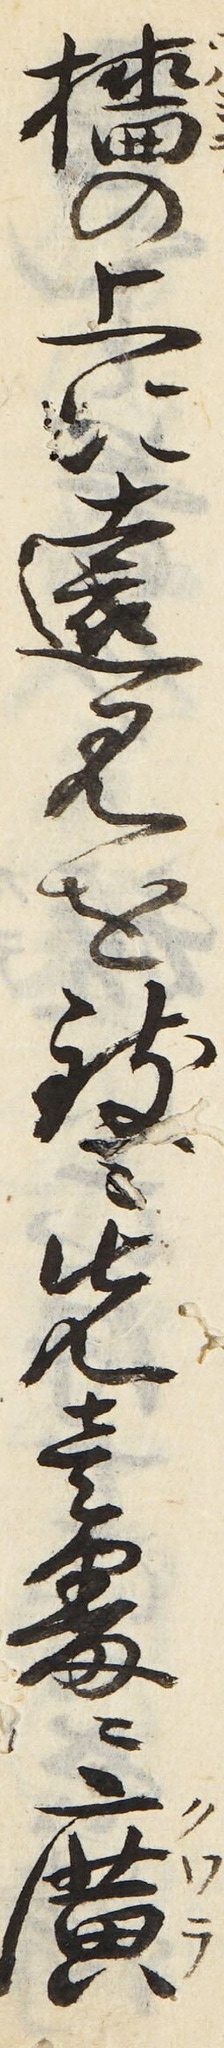檣の上に遠見を致し先壱番に広
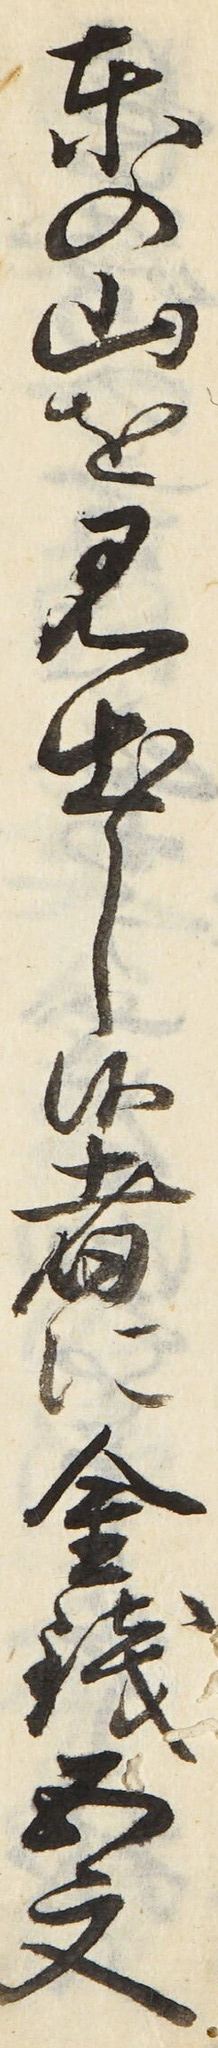東の山を見出し候者に金銭五文
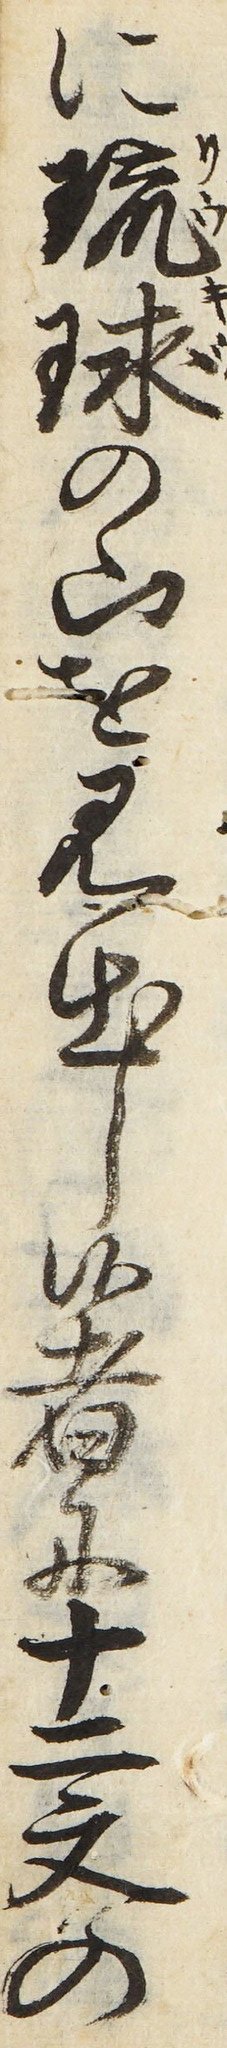に琉球の山を見出し候者に十二文の

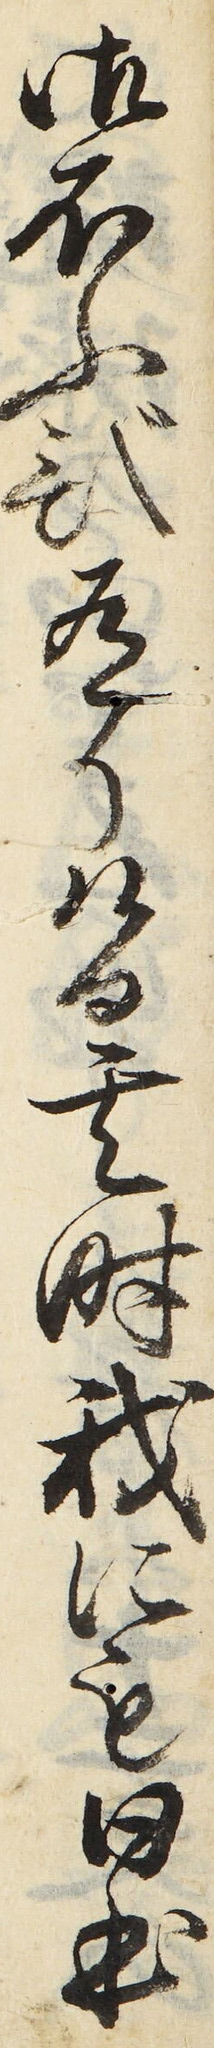御ほふび有りける其時我にも日本
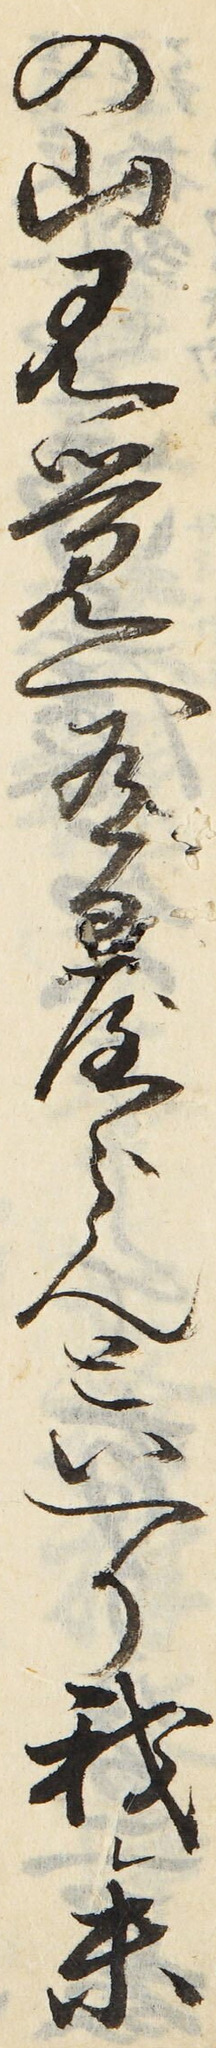の山見覚へ有るやらんといへり我れ未
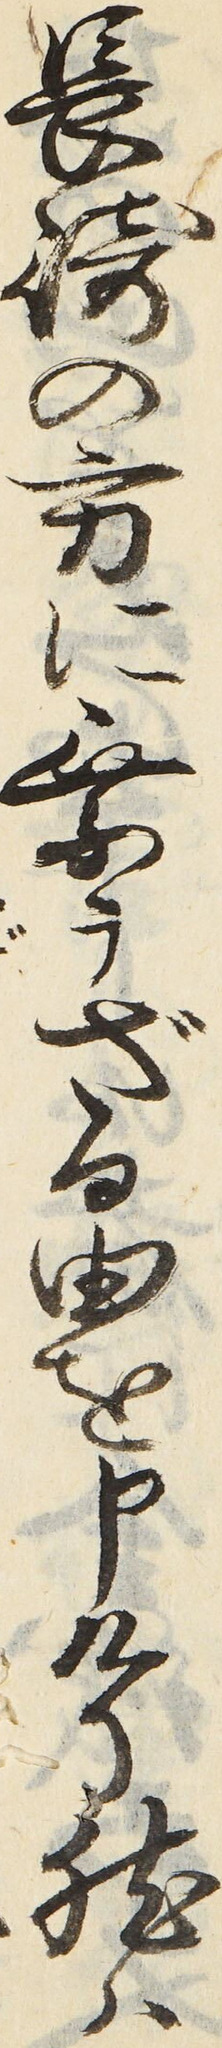長崎の方に乗らざる由を申けり然は
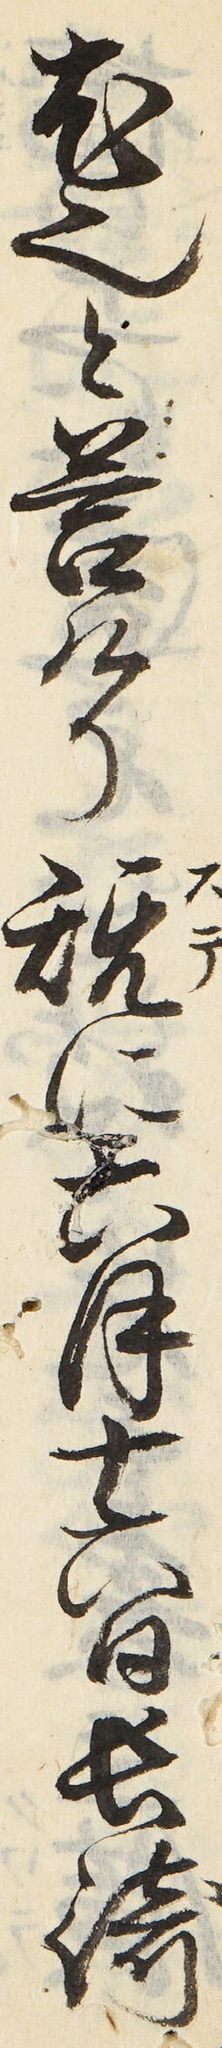尤也と云けり既に六月十六日長崎
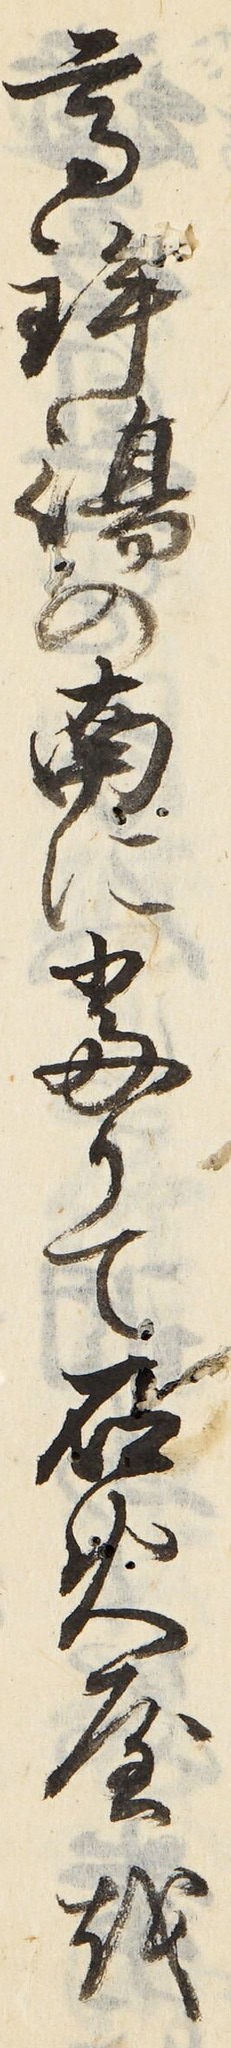高鉾嶋の南に当りて石火屋を
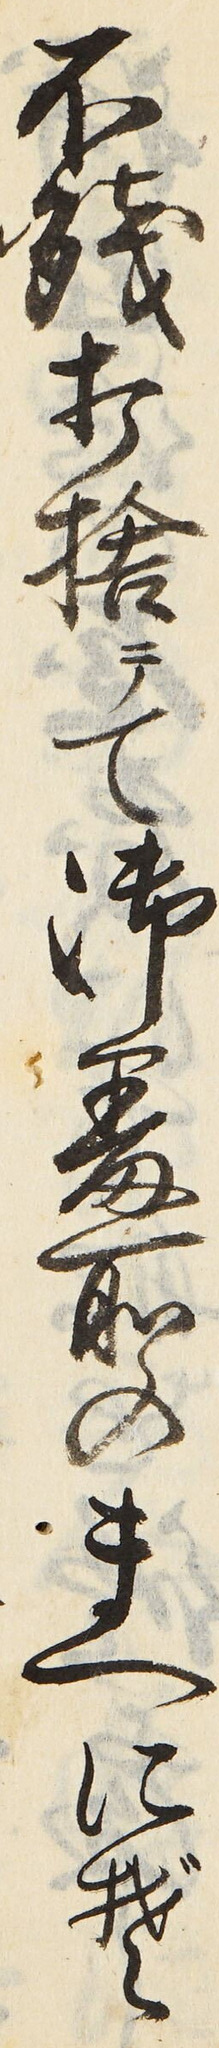不残打捨てて御番所のまへにぞ
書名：華夷九年録
